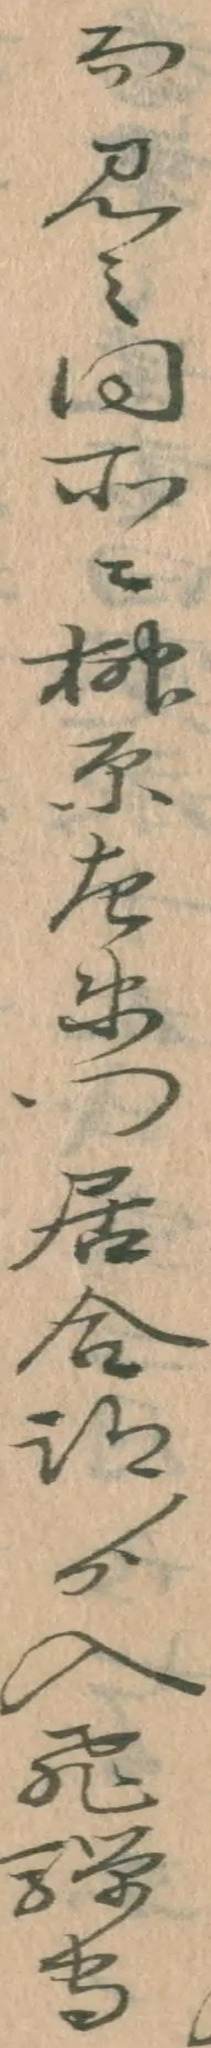而見之同所に榊原左衛門居合跡ゟ入飛騨守
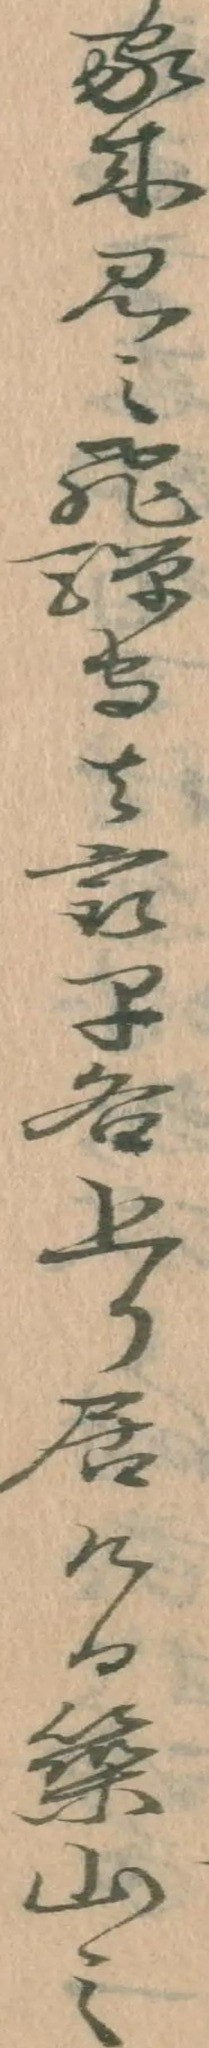家来見之飛騨守者最早各上り居ける築山之
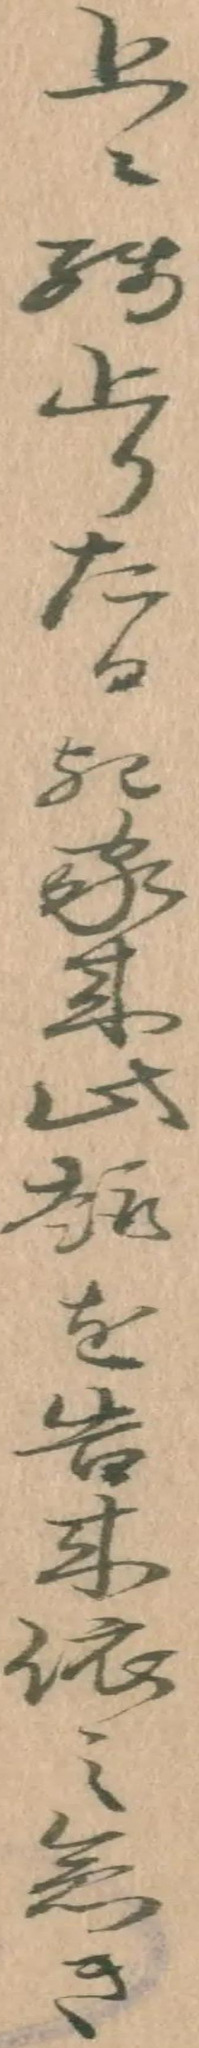上に残止りたる歟家来此趣を告来依之急き
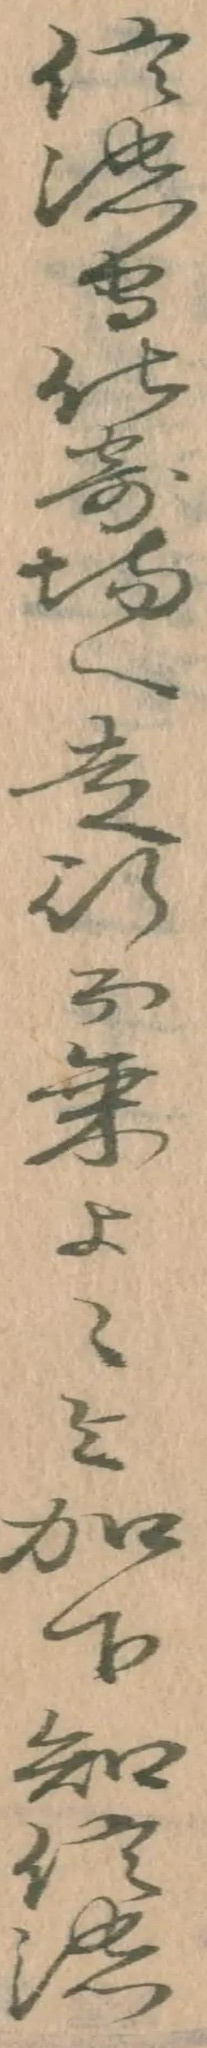信濃守仕寄場へ走行而乗よ〱与加下知信濃
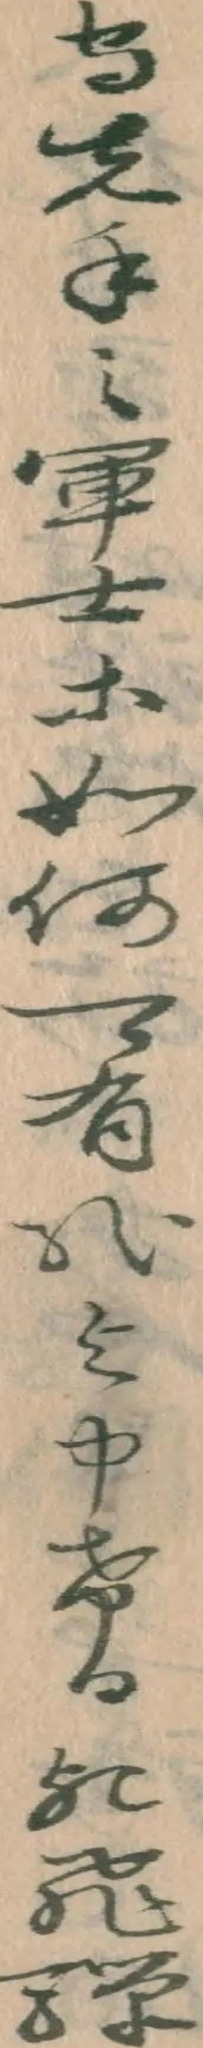守先手之軍士等如何可有哉与申希る歟飛騨
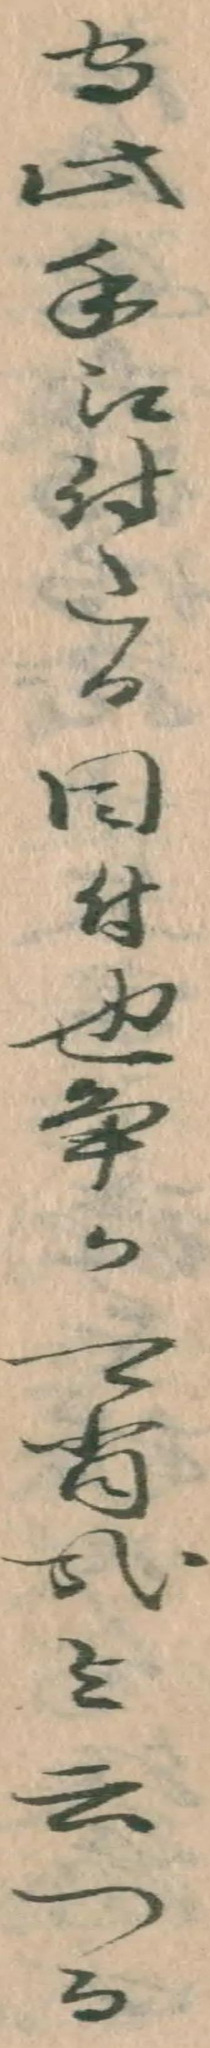守此手江付たる目付也争か可有哉与云つる
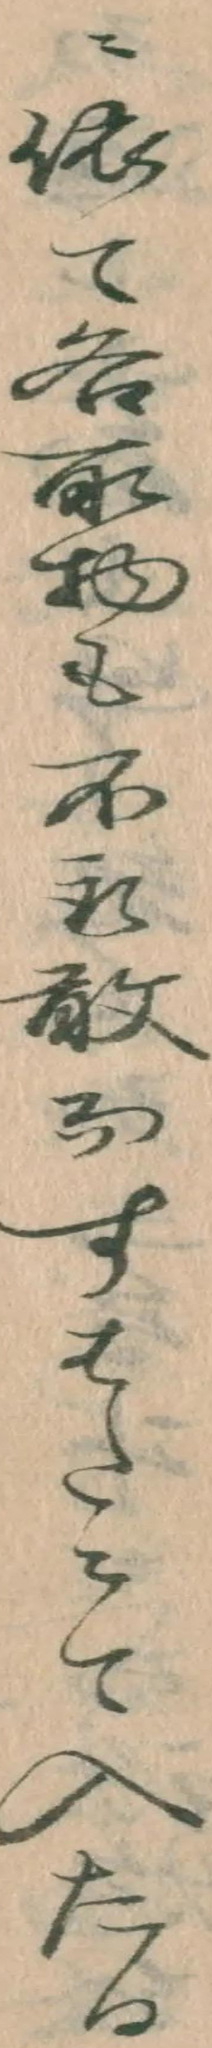に依て各取物も不取敢而すはたにて入たる
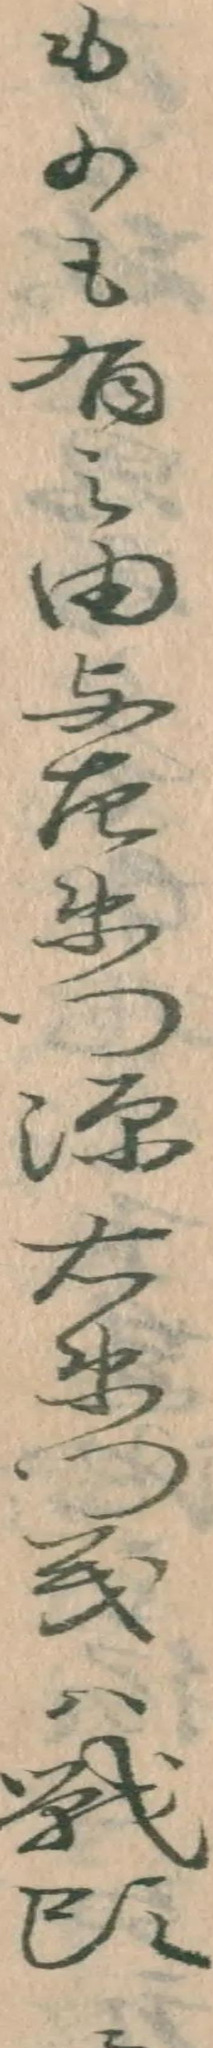ものも有之由与左衛門源右衛門義は戦頭に
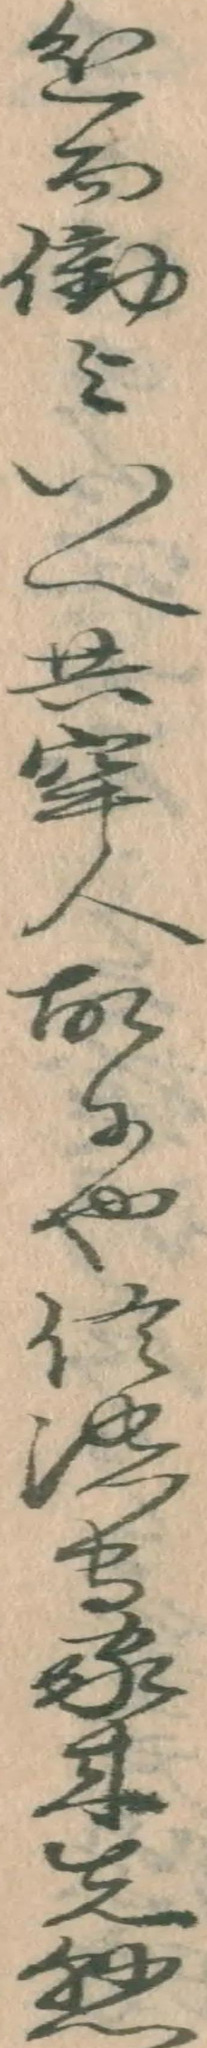進而働与いへ共牢人故尓や信濃守家来先懸
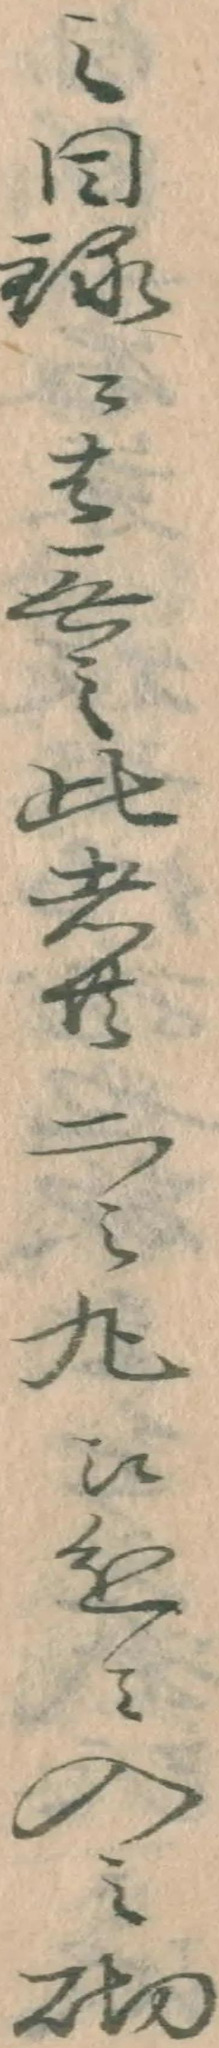之目録に者無之此者共二之丸江進み入之砌
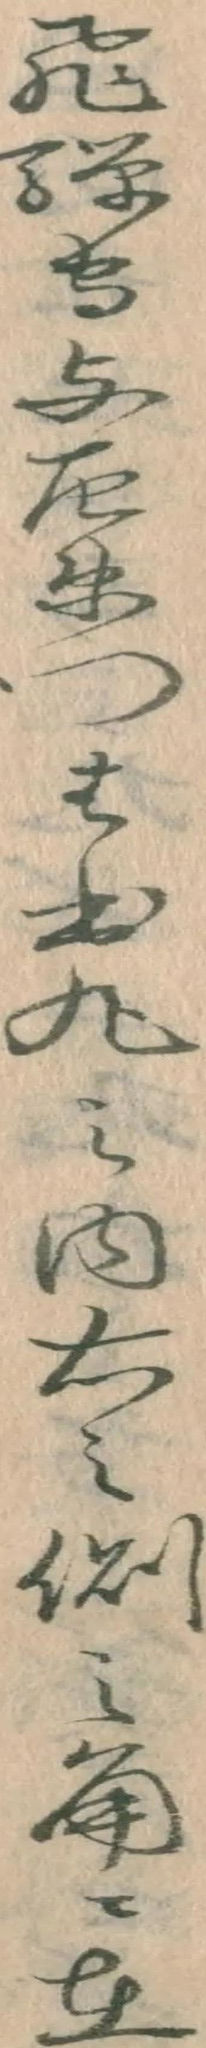飛騨守与左衛門者出丸之内右之例之角に在
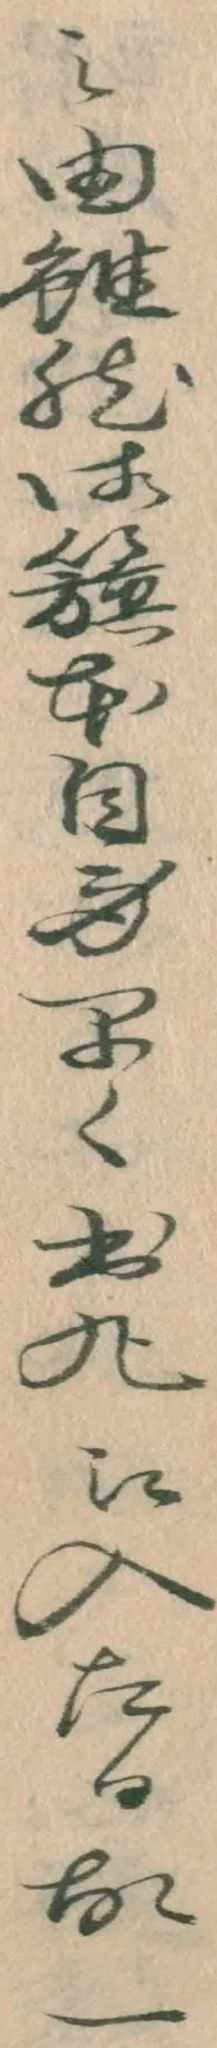之由雖然御籏本而進早く出丸江入たる故一
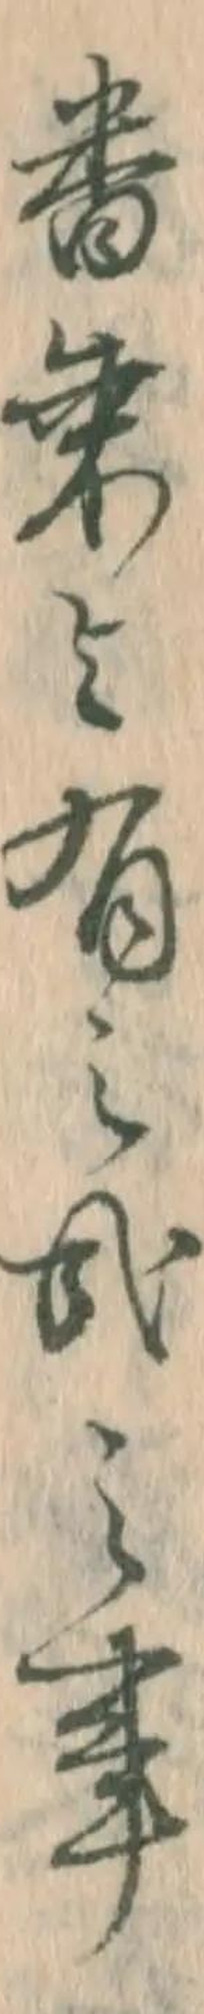番乗与有之哉之事
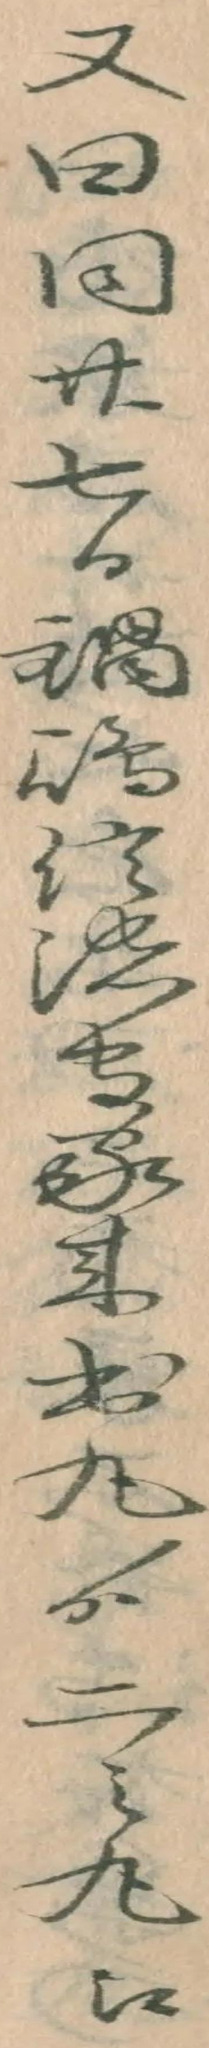又曰同廿七日鍋島信濃守家来出丸ゟ二之丸江

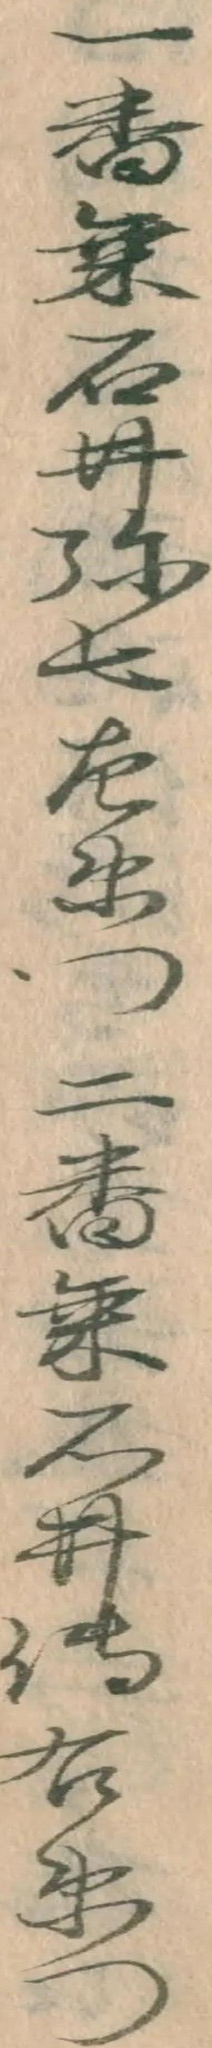一番乗石井弥七左衛門弐番乗石井伝右衛門
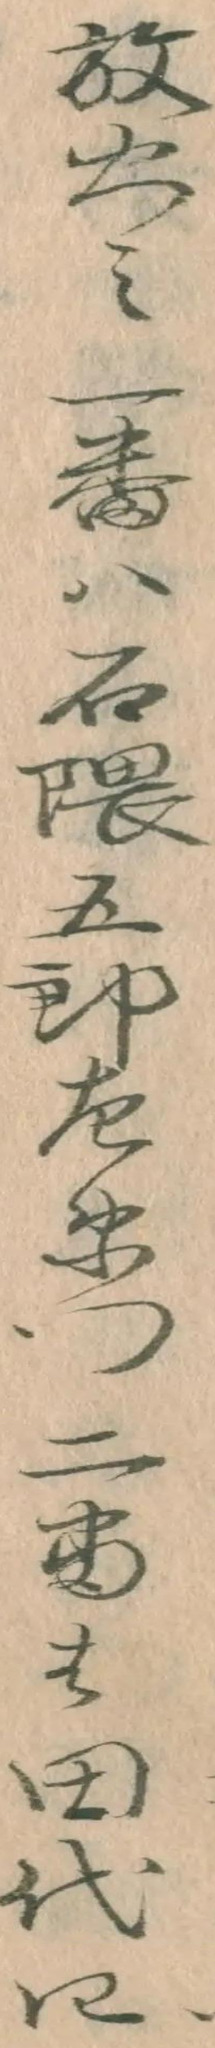放火之一番は石隈五郎左衛門弐番者田代四
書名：切支丹御退治記 49巻. [8]
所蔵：国立国会図書館 National Diet Library, JAPAN
